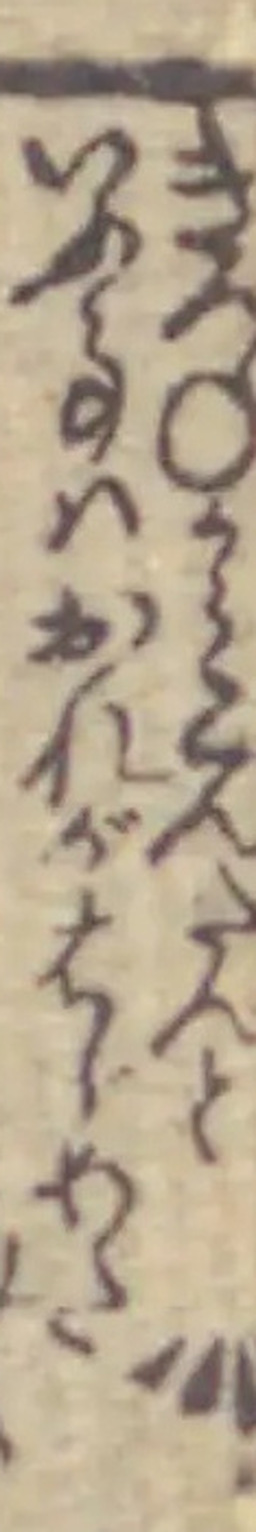いふ事はおれがはじめた
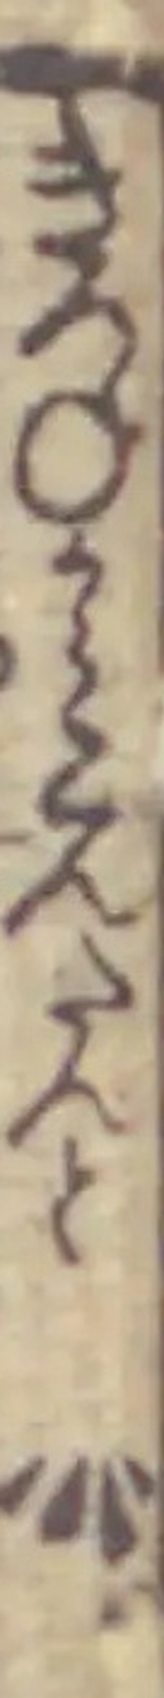きつねかゝこんこんと
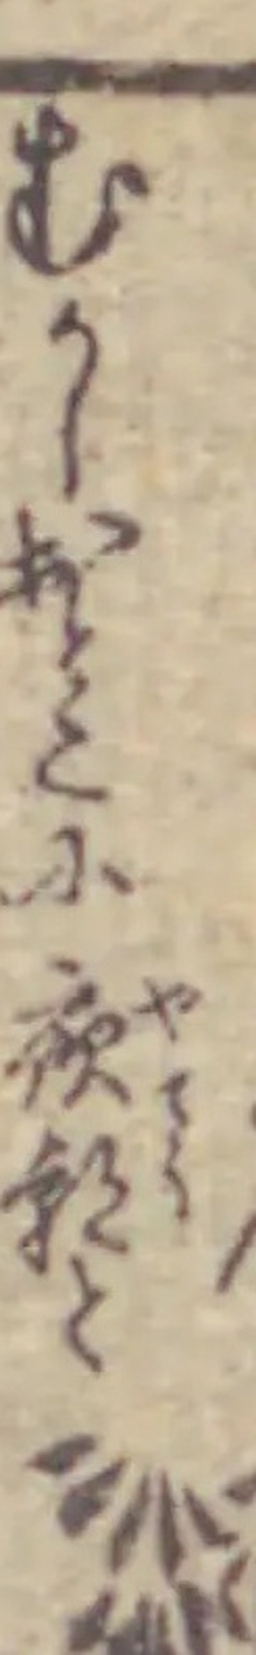むかしおとこに夜朝と
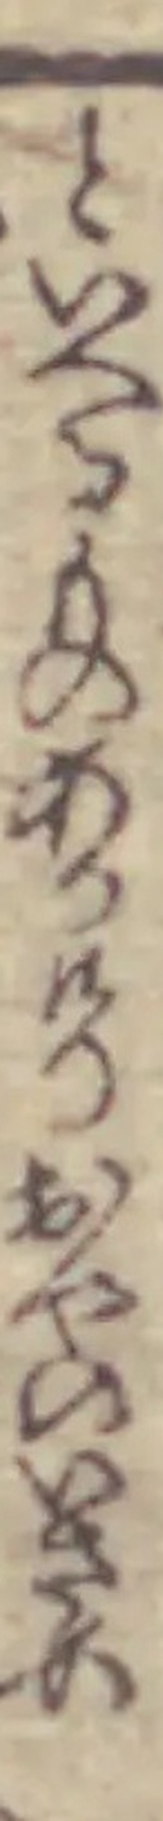といへるものありけりおやのいさめ
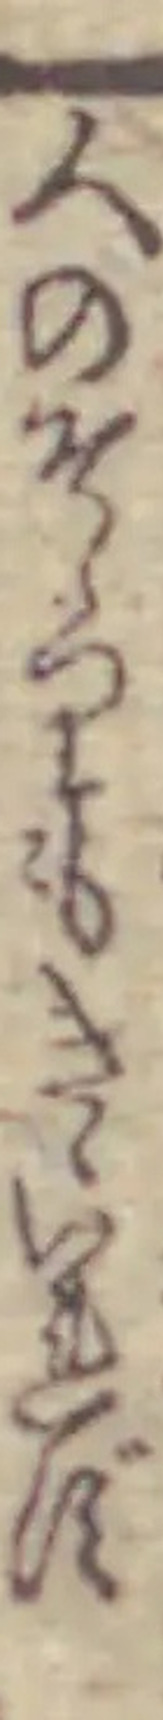人のそしりもきゝいれず
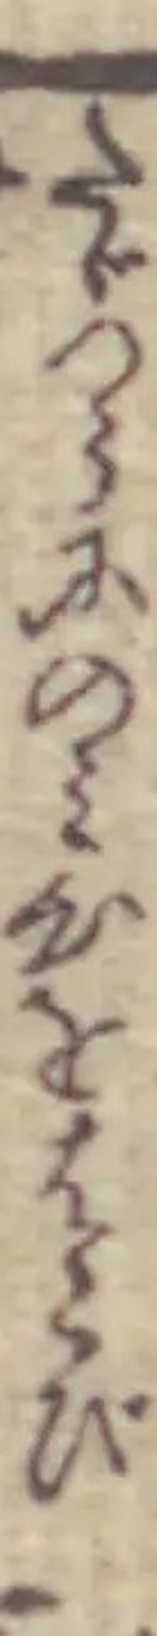たゞつうにのみ心をはこび
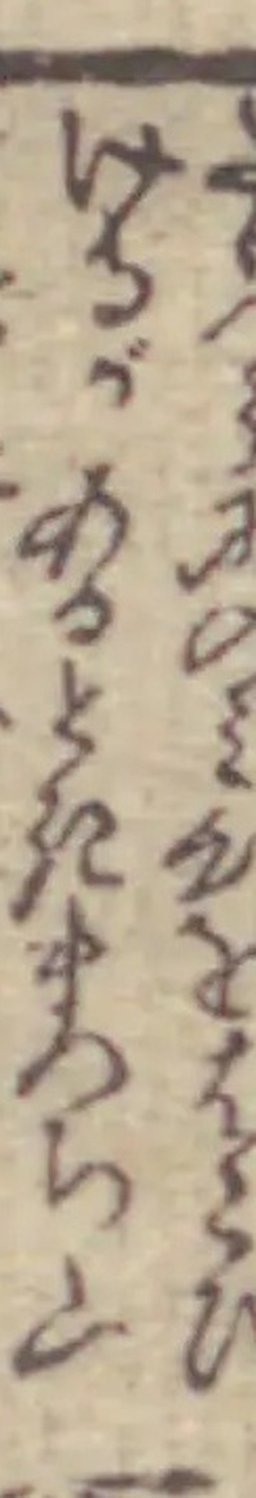けるがあるときまつち山
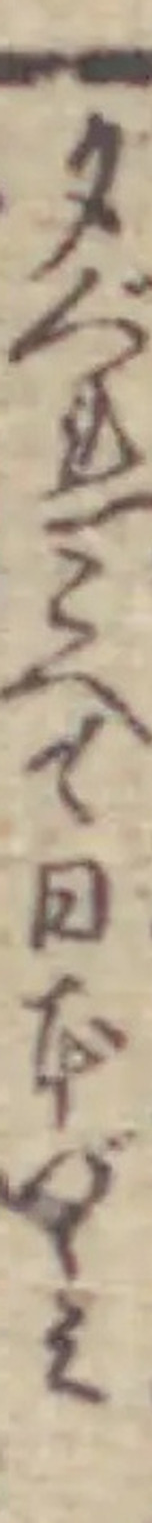夕ぐれこへて日本づゝみ
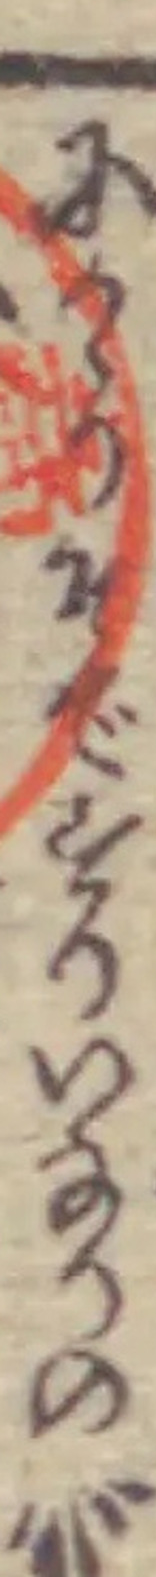にかゝりそですりいなりの
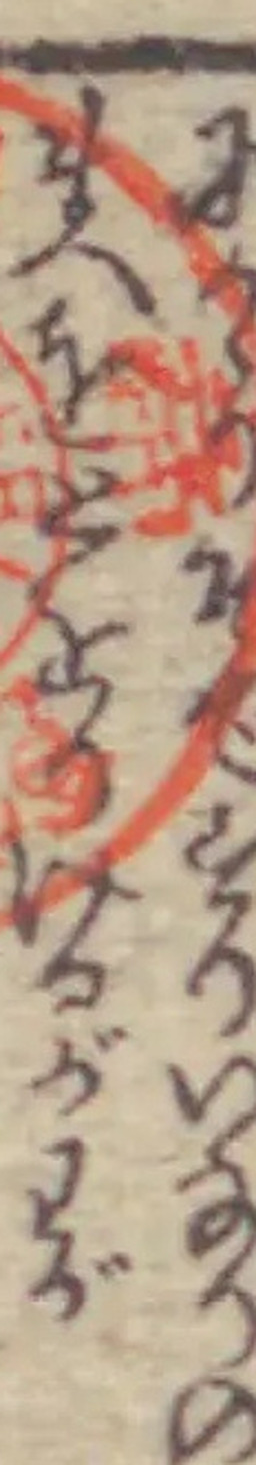まへをとをりけるがわが
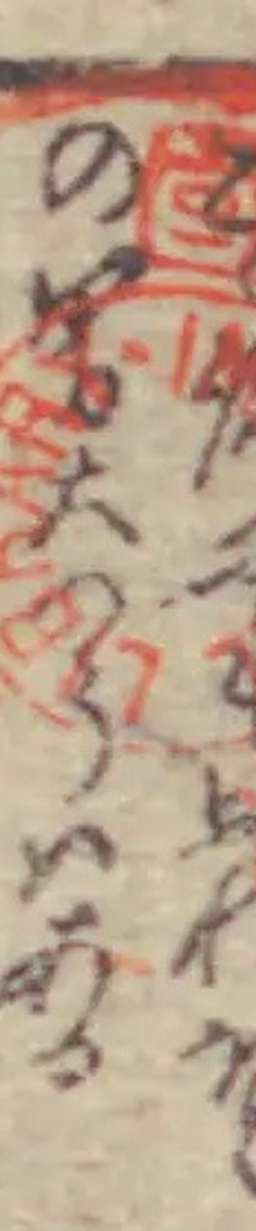の男大つうはある
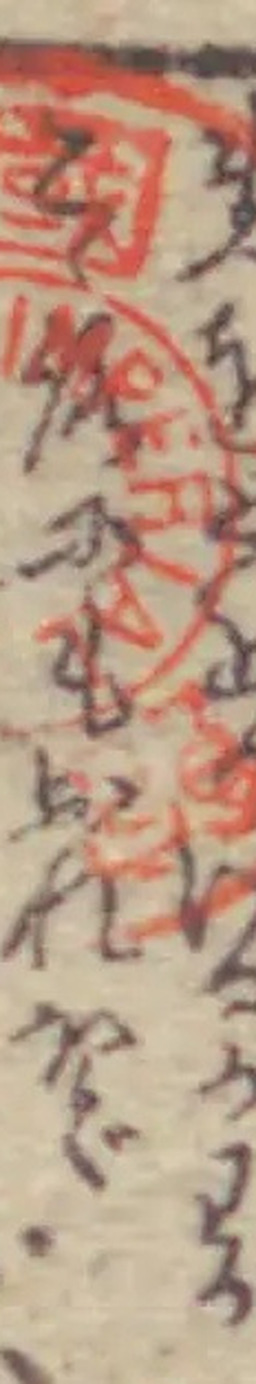こゝろにもおれほど
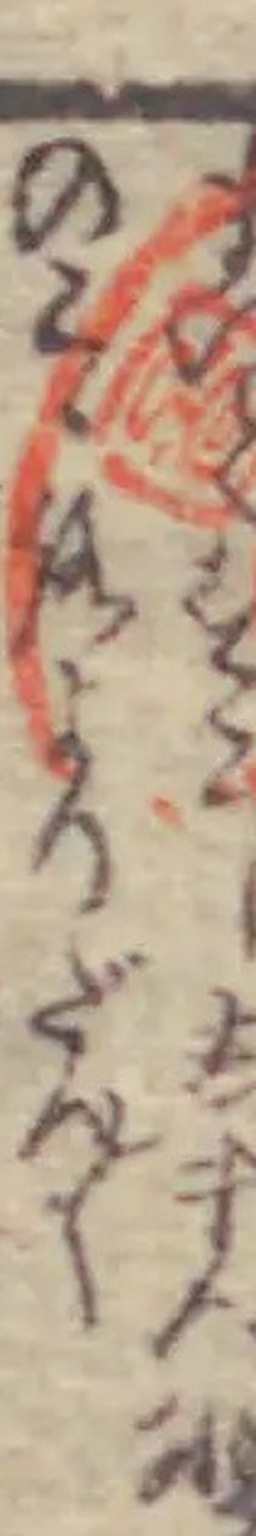のこゝろよりだん〳〵
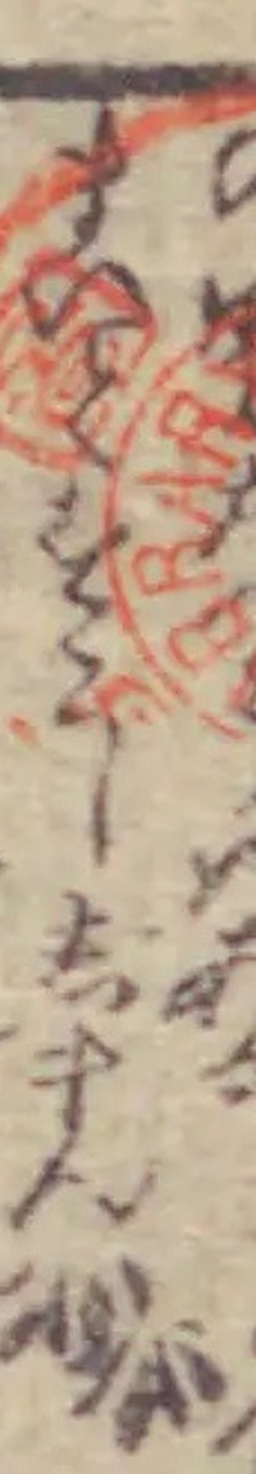まいとすこしじまん
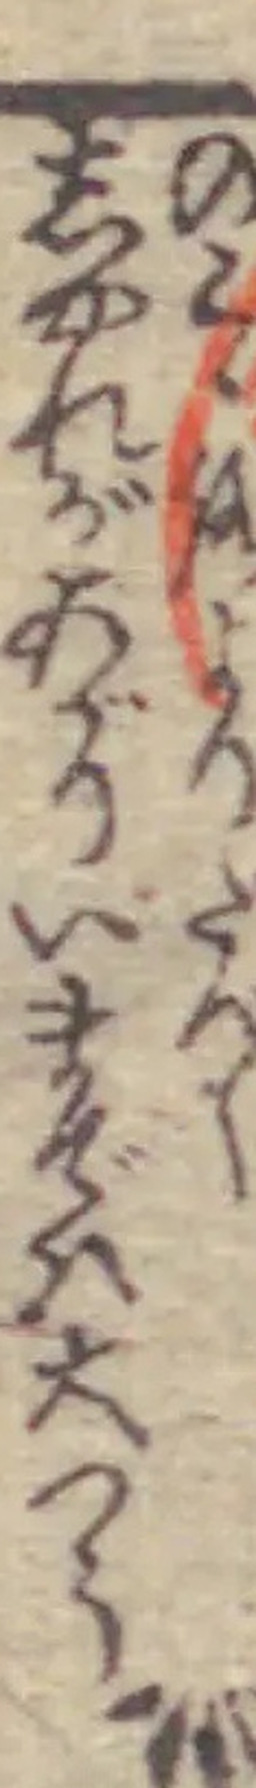しやれがあがりいまでは大つう
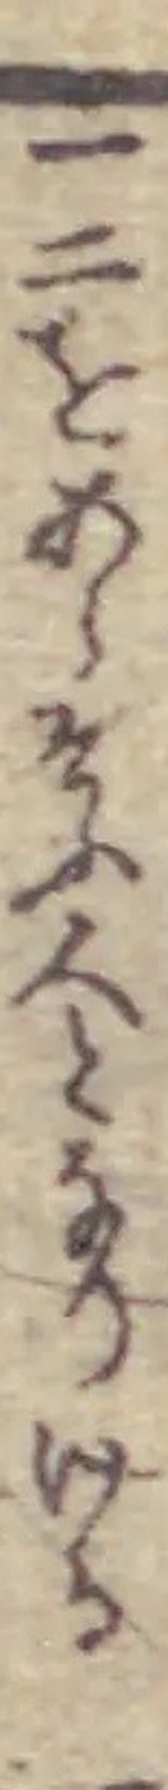一二をあらそふ人となりける
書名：夜野中狐物 2巻
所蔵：国立国会図書館 National Diet Library, JAPAN
